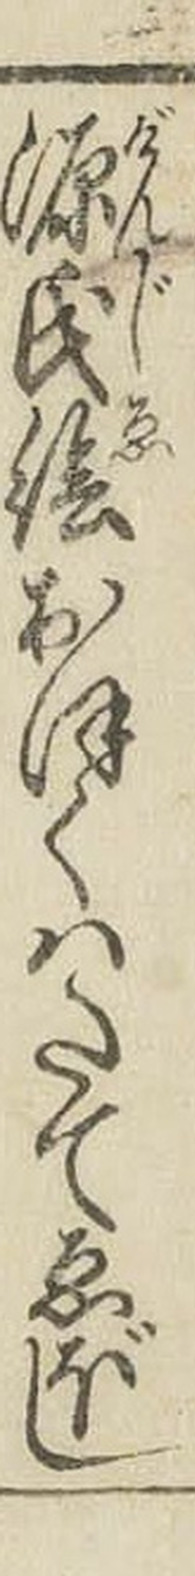源氏絵おほくはたてゑぼし
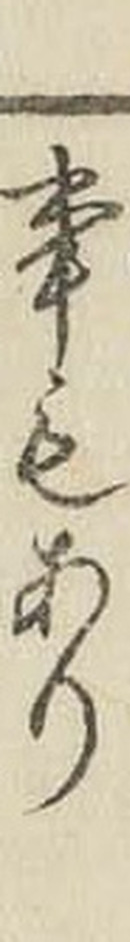事もあり
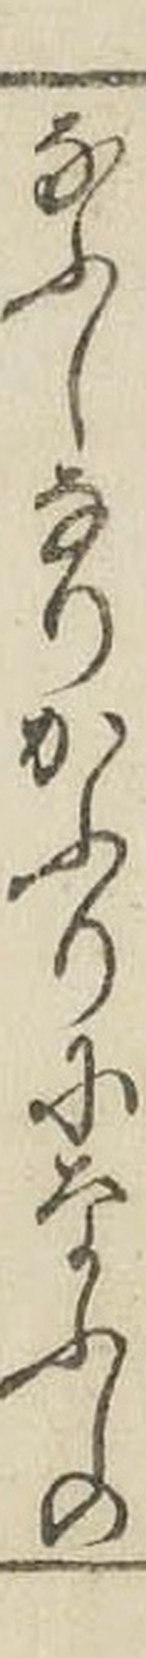なふしなりかふりになふしの
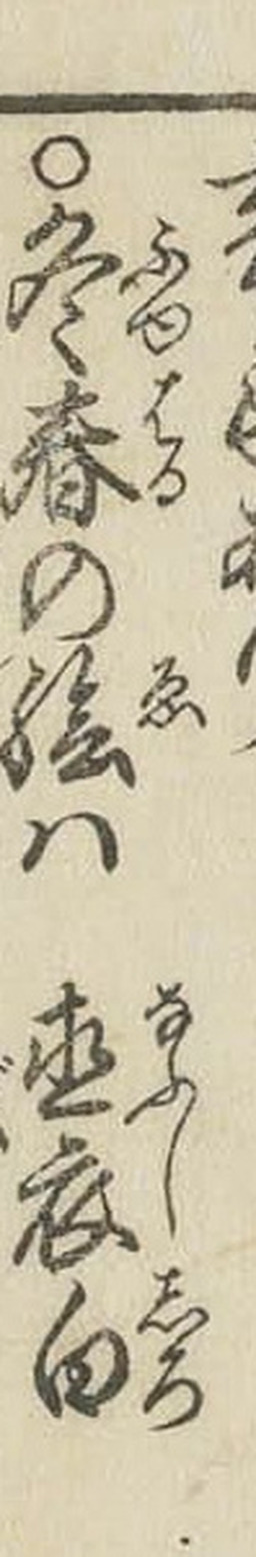○冬春の絵は直衣白
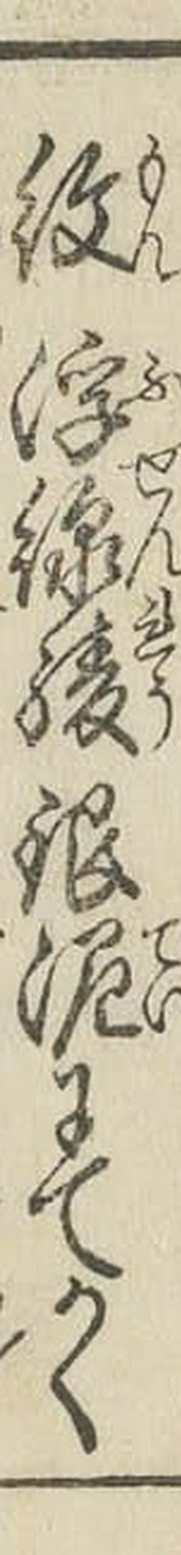紋浮線綾銀泥にてかく
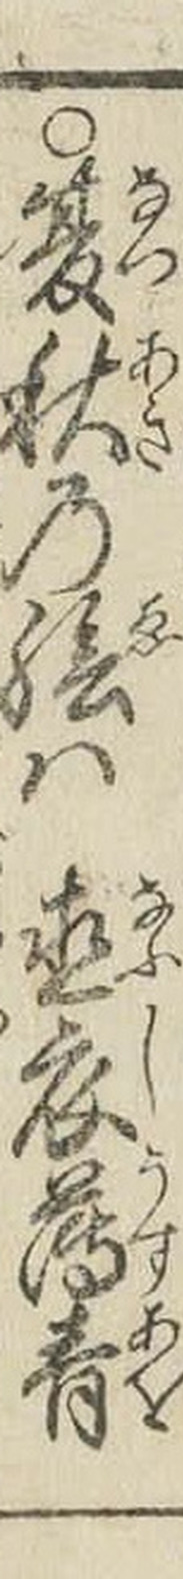○夏秋の絵は直衣薄青
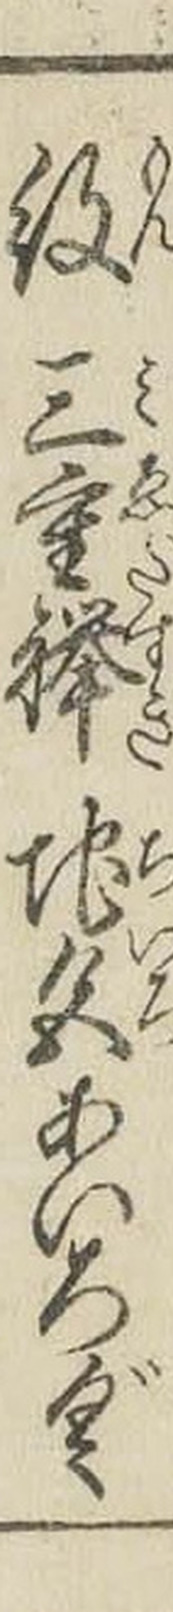紋三重襷地色あいろぐ
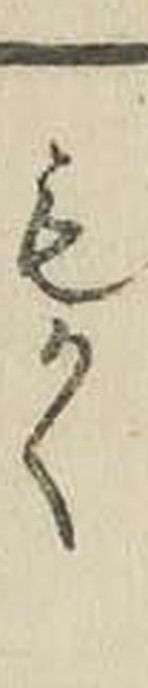もかく
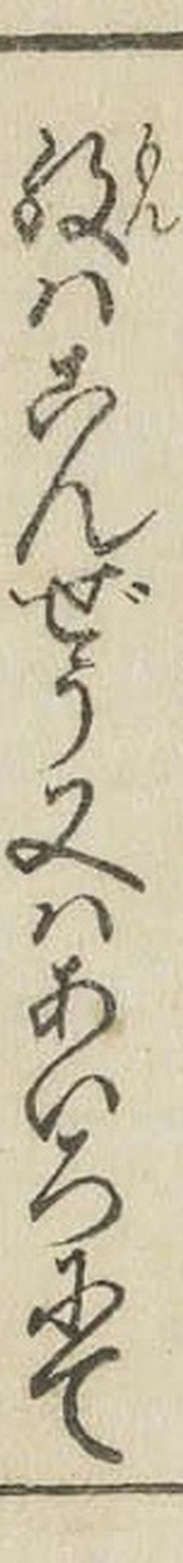紋はしんぜう又はあいろにて
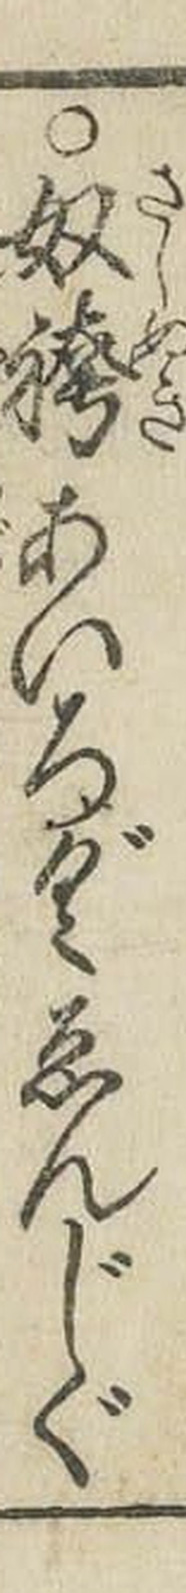○奴袴あいろぐゑんじぐ
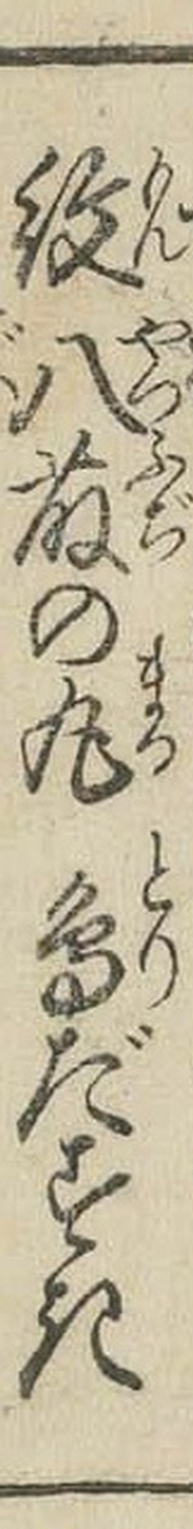紋八藤の丸鳥だすき
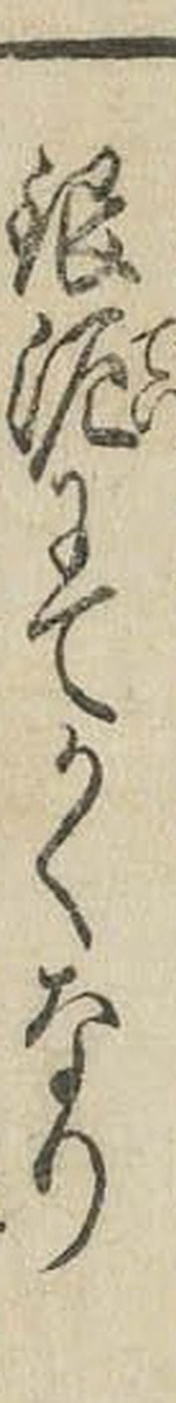銀泥にてかくなり
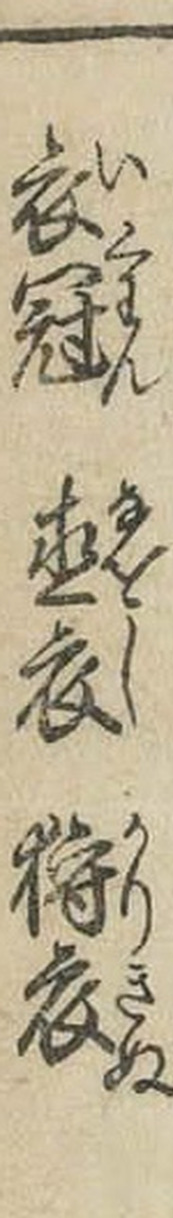衣冠直衣狩衣
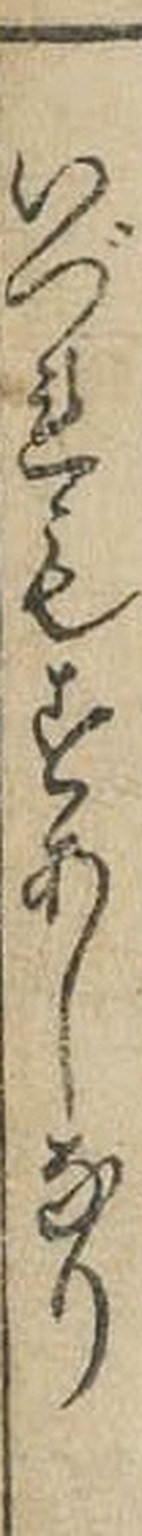いづれもすあしなり

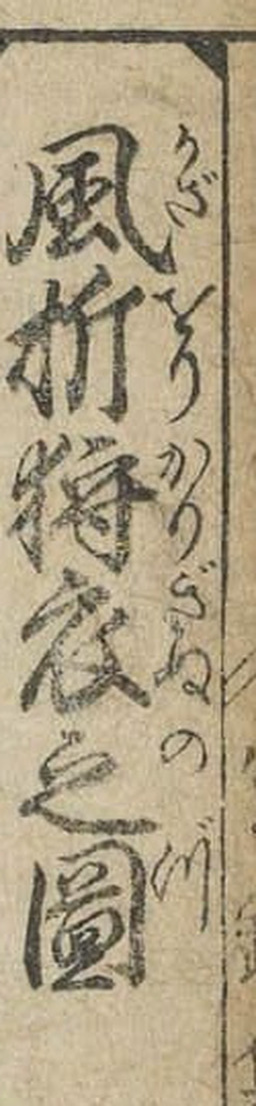風折狩衣之図
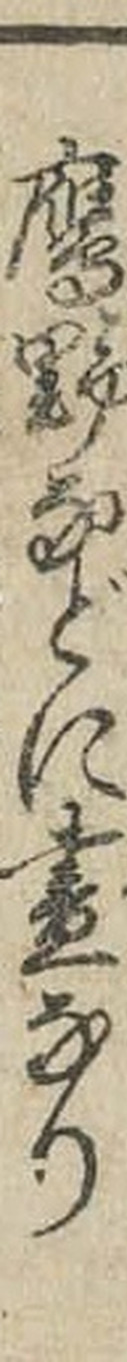鷹野などに畫なり
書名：絵本写宝袋 9巻 1之巻
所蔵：東京学芸大学教育コンテンツアーカイブ
